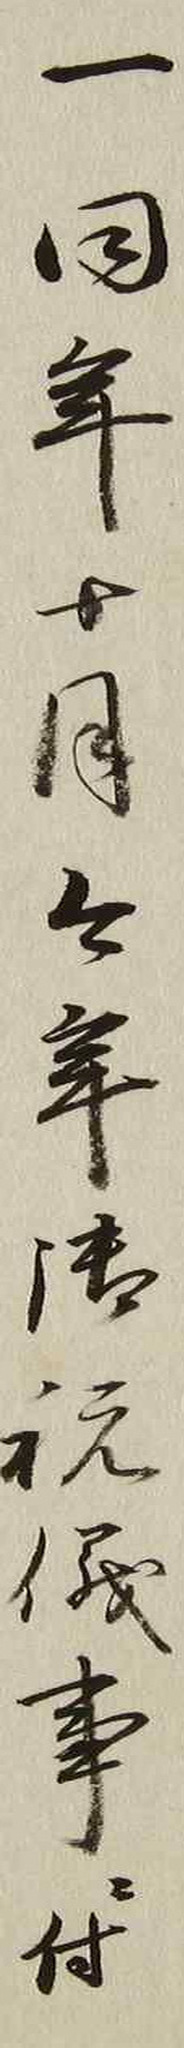一同年十月今年御祝儀事ニ付
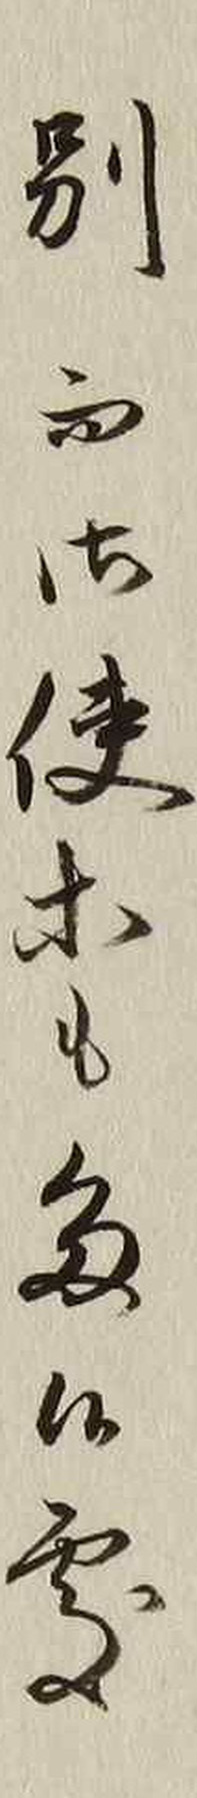別而御使等も多候処
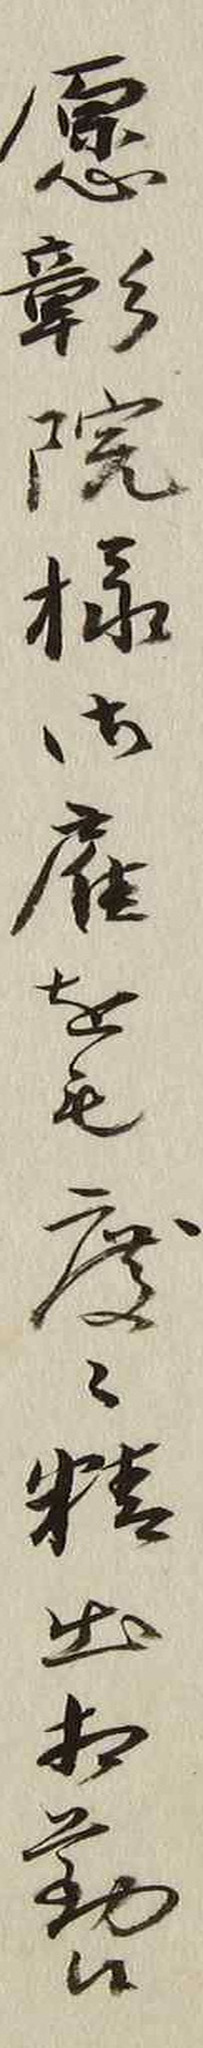愿彰院様御雇をも度々精出相勤候
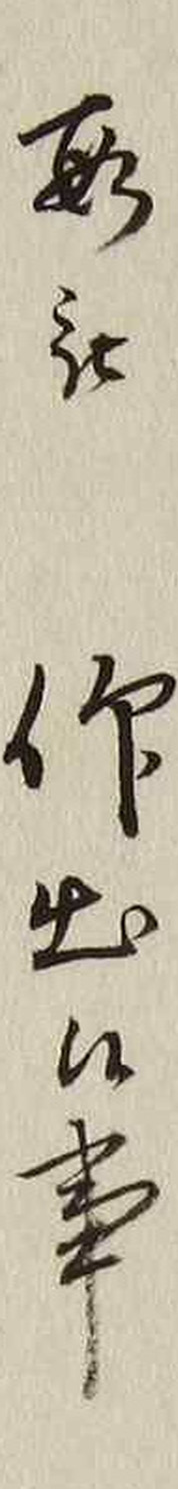段被仰出候事
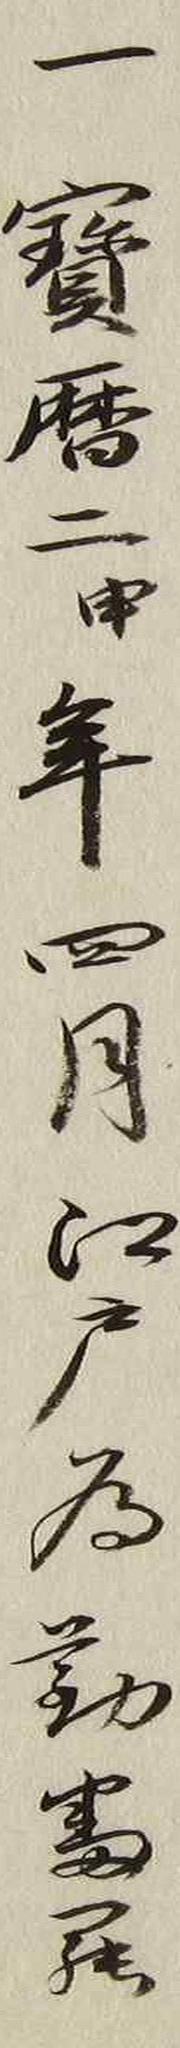一宝暦二申年四月江戸為勤番罷
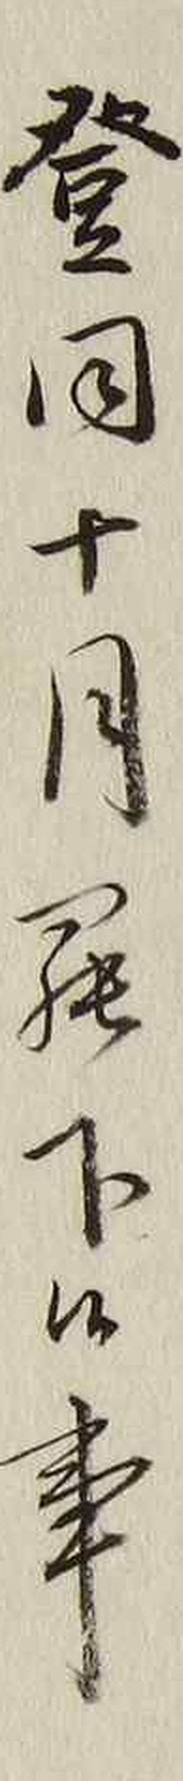登同十月罷下候事
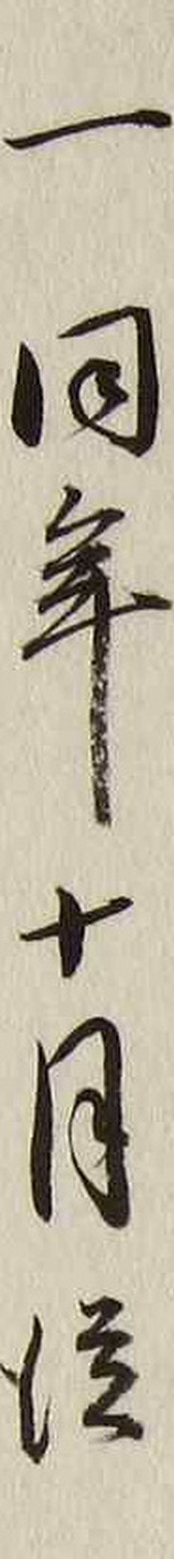一同年十月従
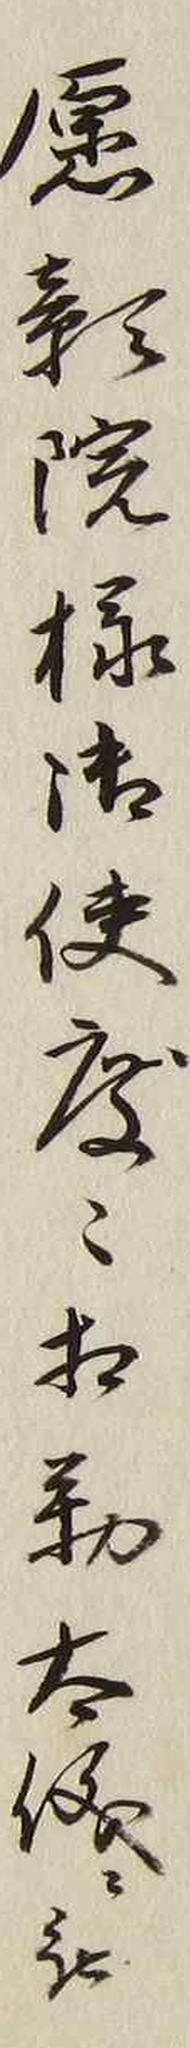愿彰院様御使度々相勤太儀ニ被
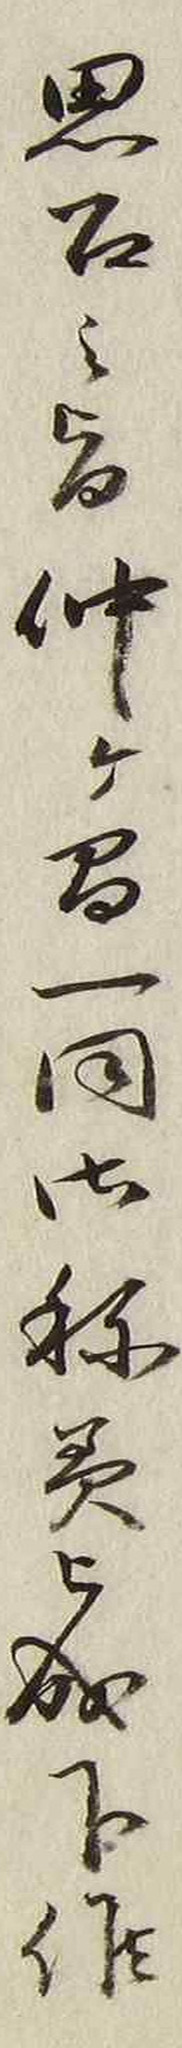思召之旨仲ケ間一同御賞美被成下候

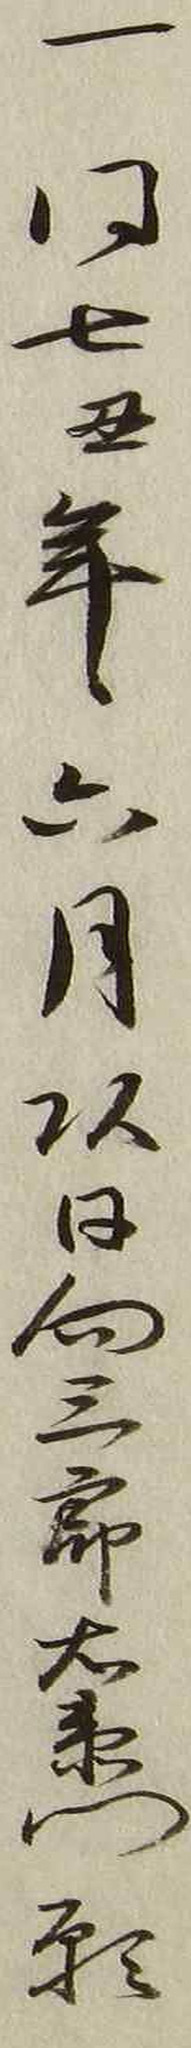一同七丑年六月頭日向三郎右衛門願
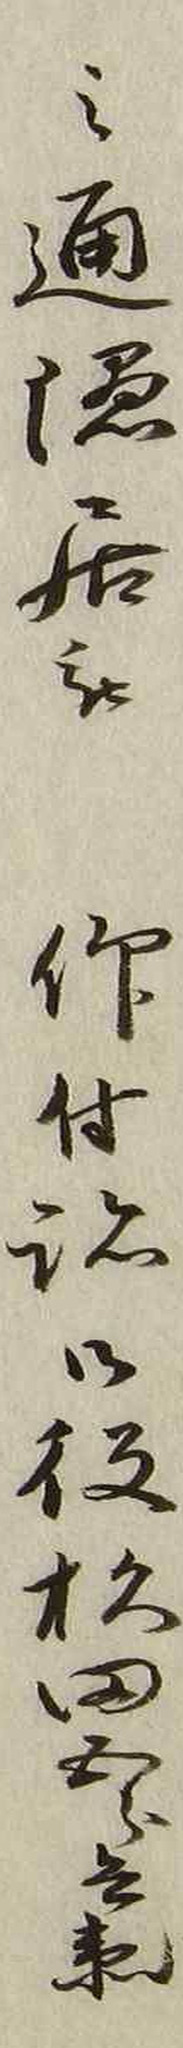之通隠居被仰付跡御役杉田五郎兵衛
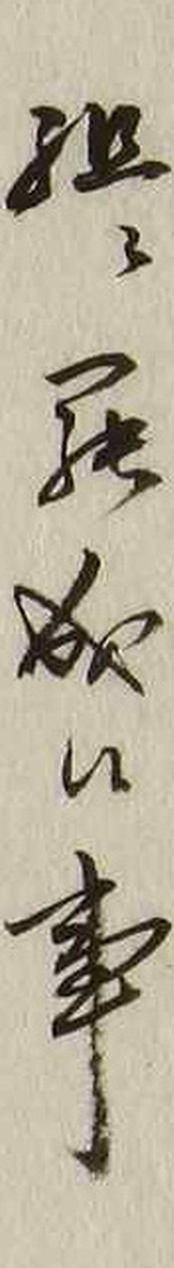組ニ罷成候事
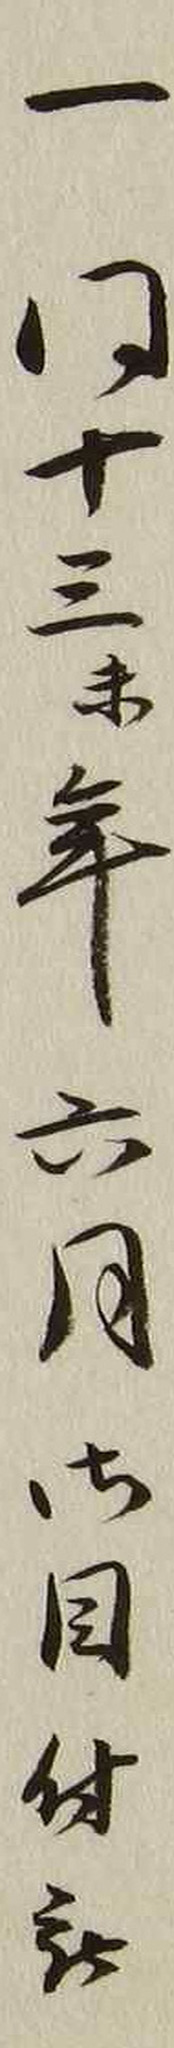一同十三未年六月御目付被
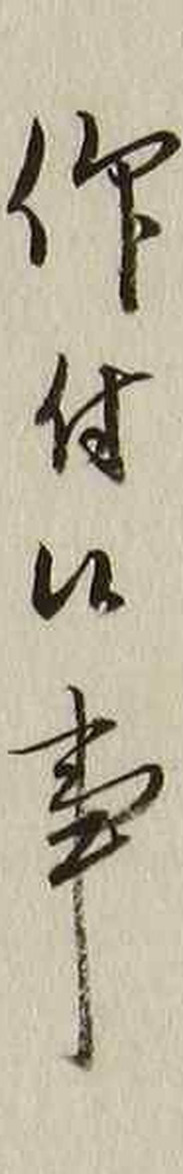仰付候事
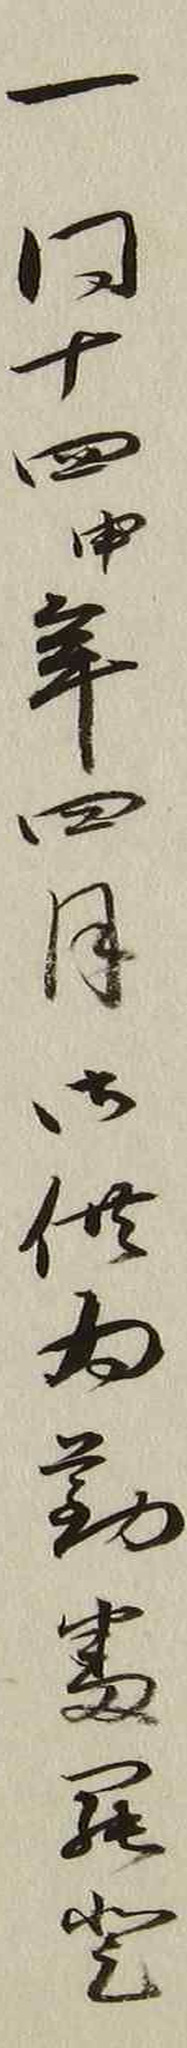一同十四申年四月御供為勤番罷登
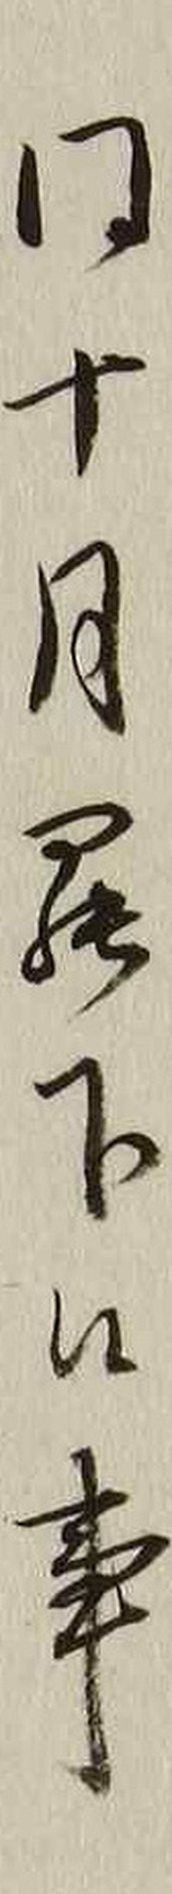同十月罷下候事
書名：諸士系譜　巻之160　な之部2
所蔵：会津若松市立会津図書館
